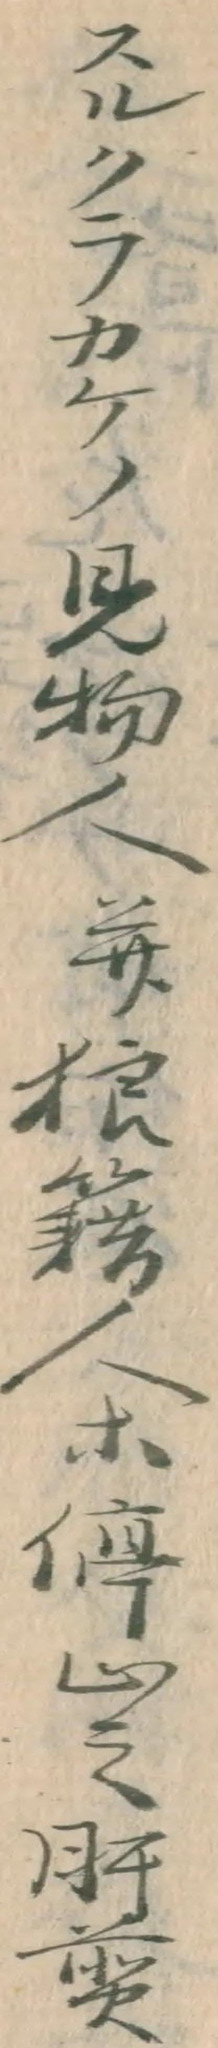スルクラカケノ見物人并狼藉人等停止之肝煎
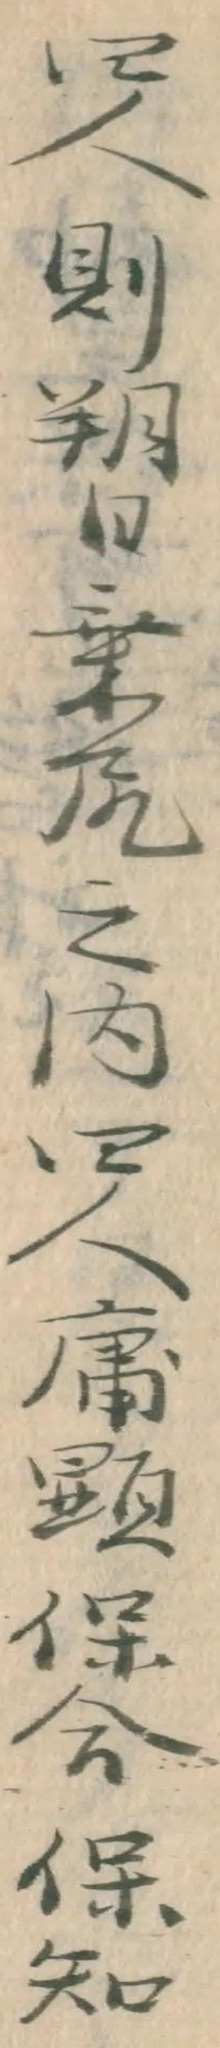四人則朔日乗尻之内四人庸顕保合保知
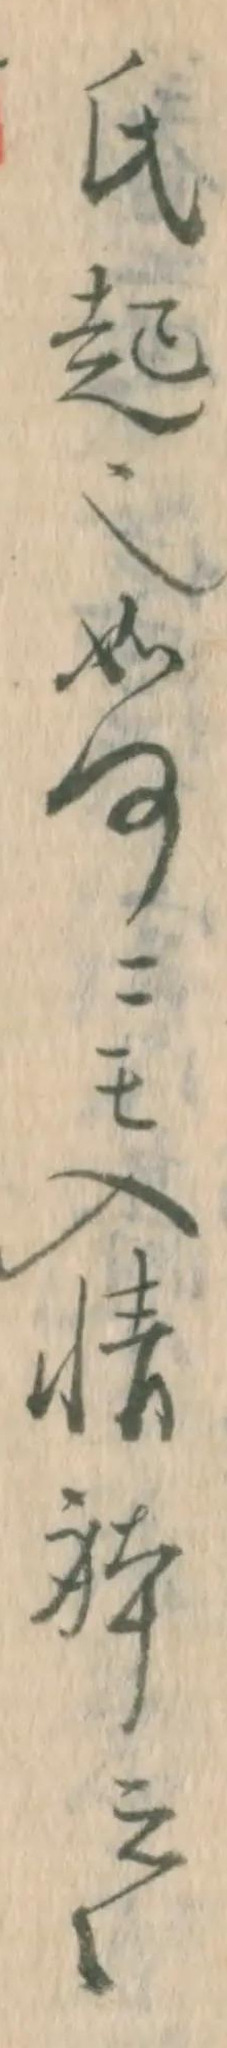氏起也如何ニモ入情体云々
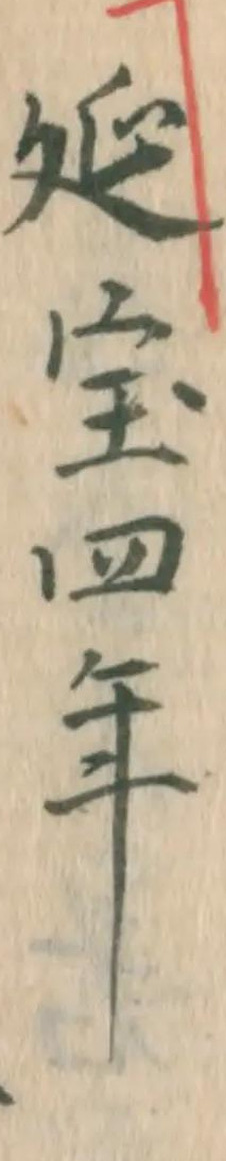延宝四年
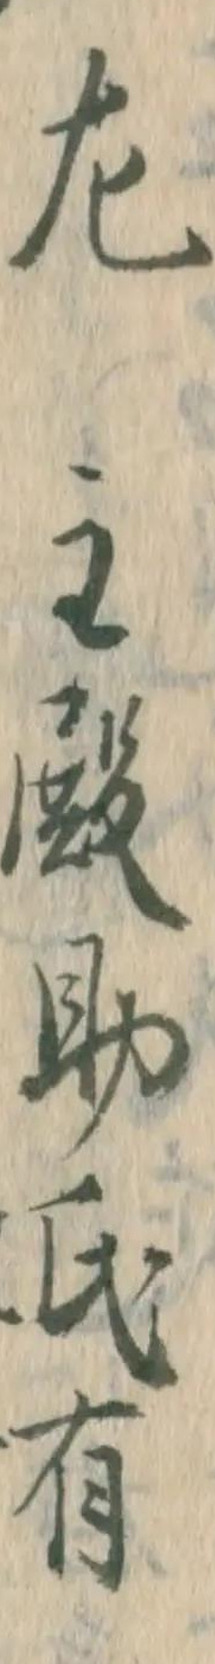左主殿助氏有
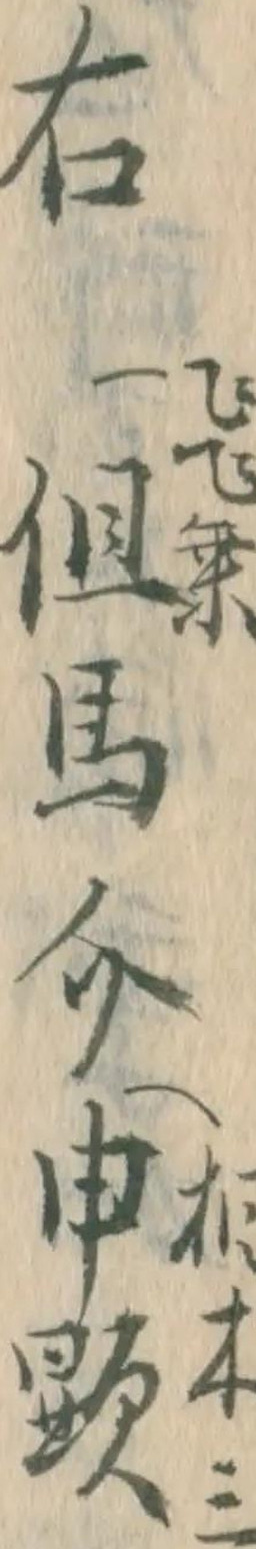右但馬介申顕

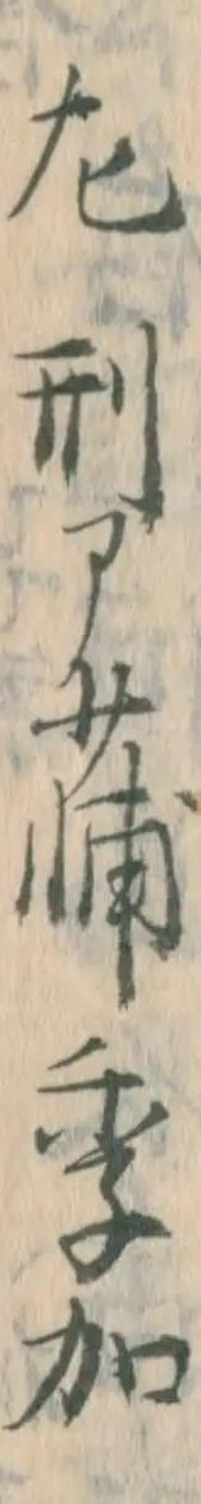左刑部少輔季加
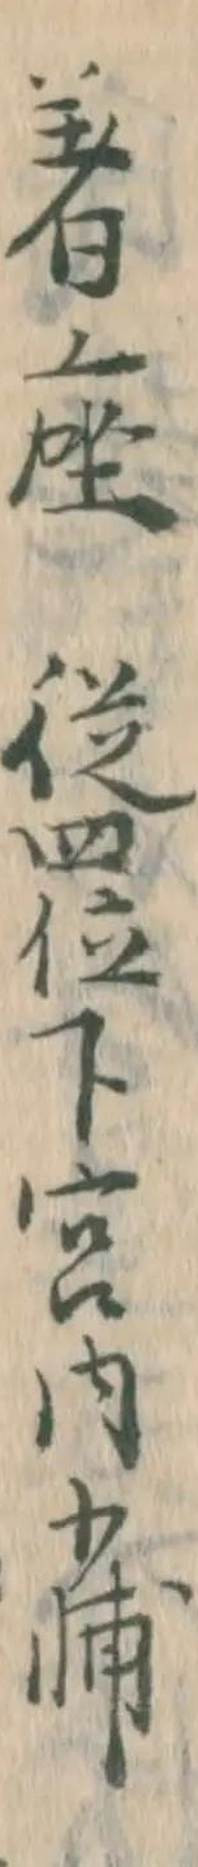者座従四位下宮内少輔
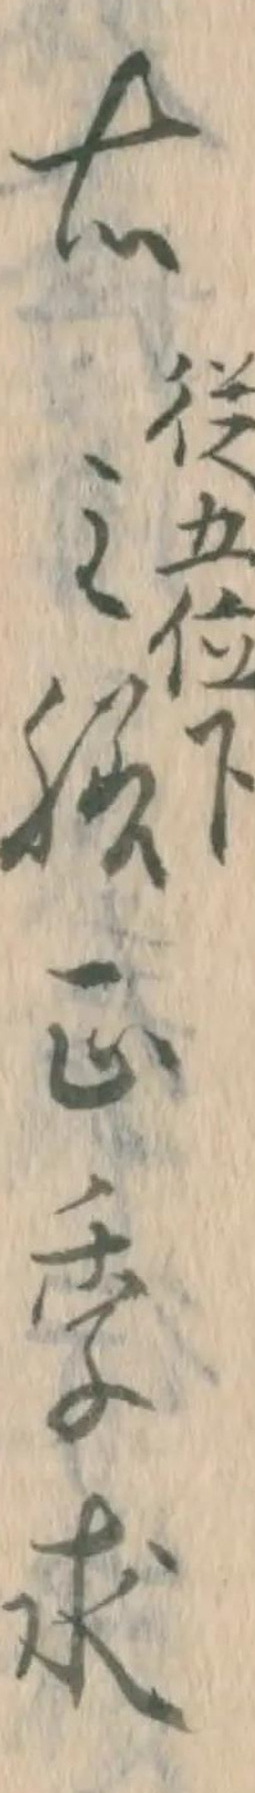右主殿正季求
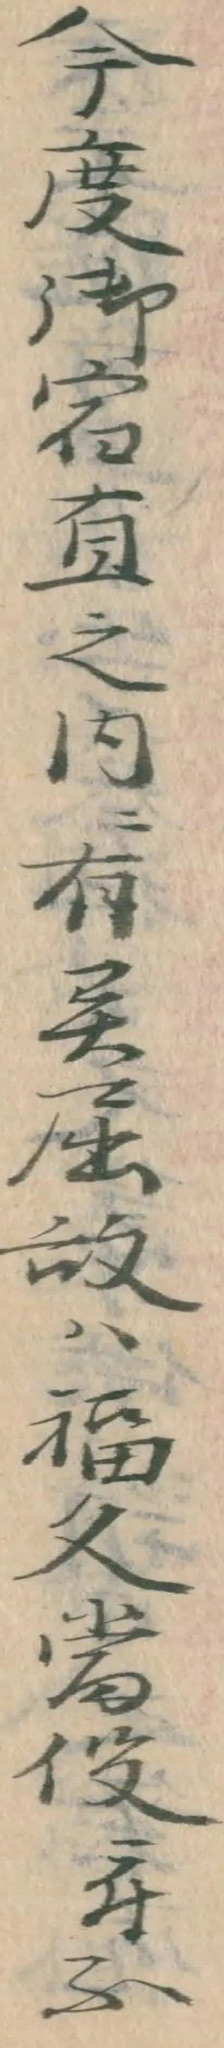今度御宿直之内ニ有異屈故ハ福久当役ニ付不
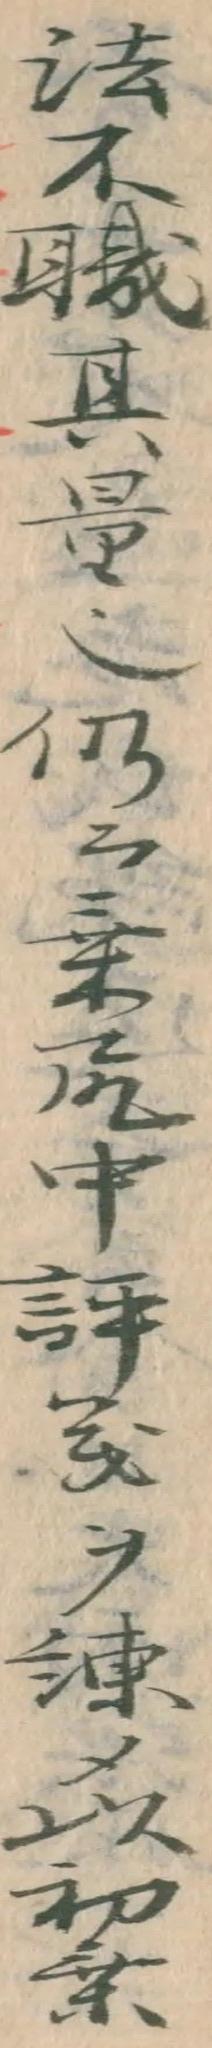法不職其量也仍而乗尻中評義ヲ諫シテ以初乗
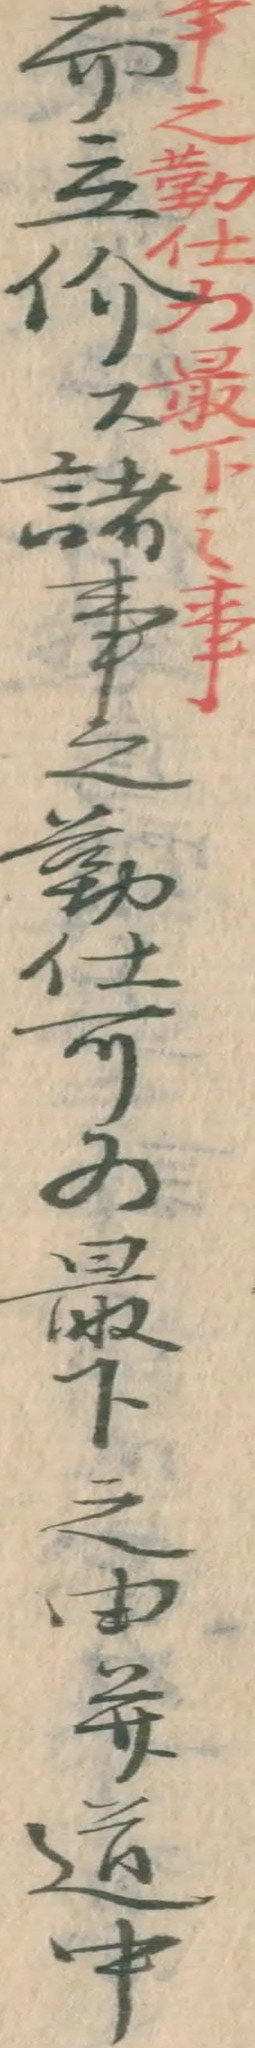而立价ス諸事之勤仕可為最下之由并道中
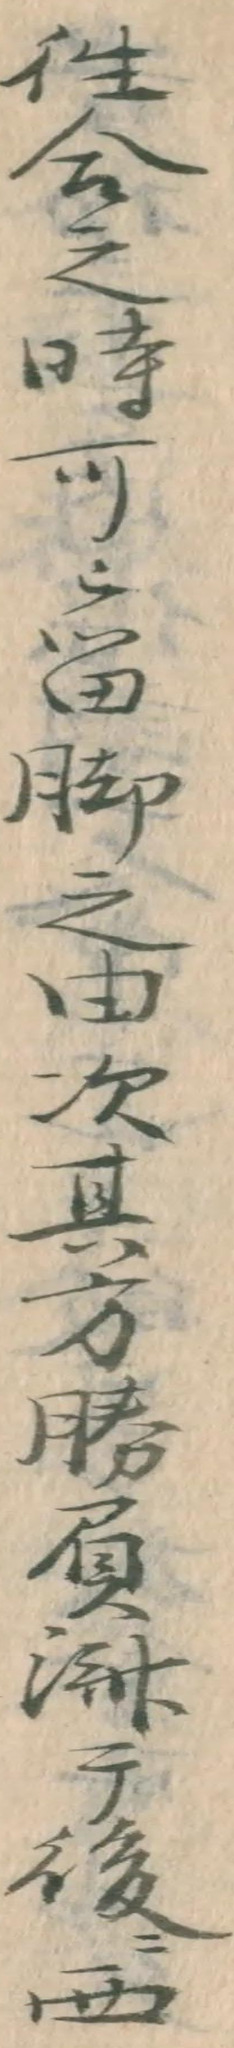往合之時可被留脚之由次其方勝負済テ後ニ西
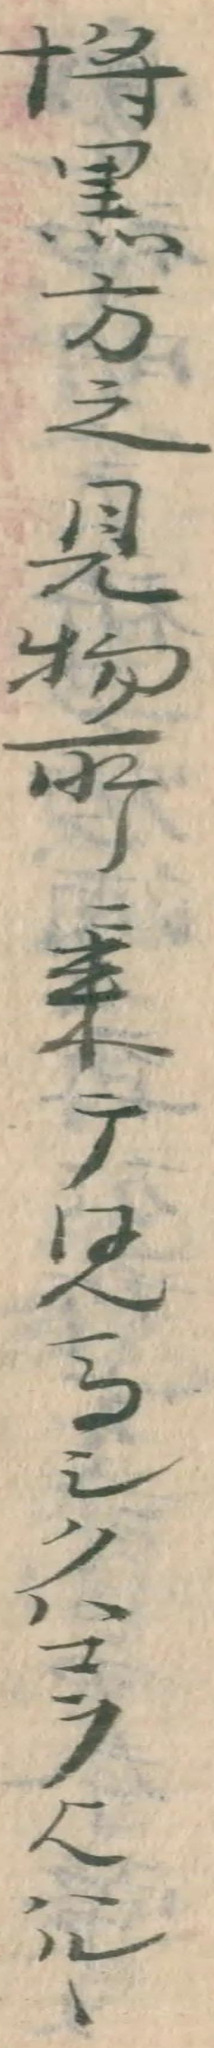埒黒方之見物所ニ来テ見馬シクハコヲ見ハルヽ
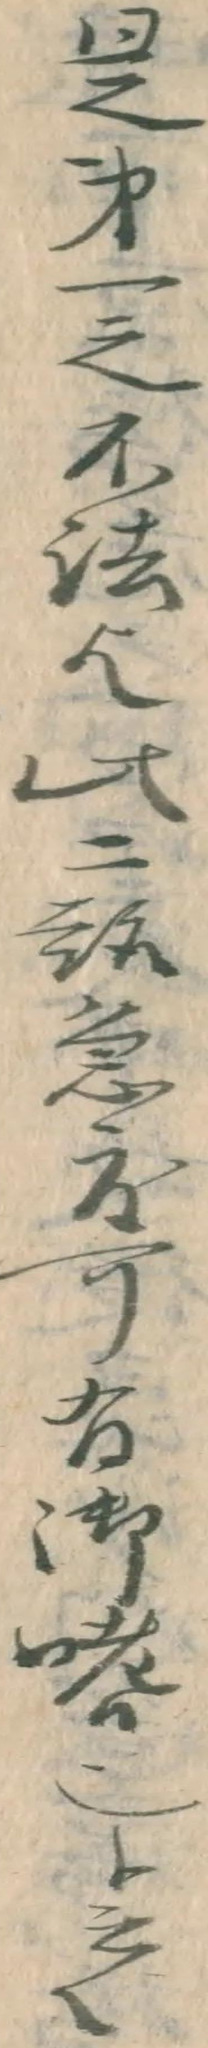是第一之不法也此二趣急度可有御嗜也ト云々
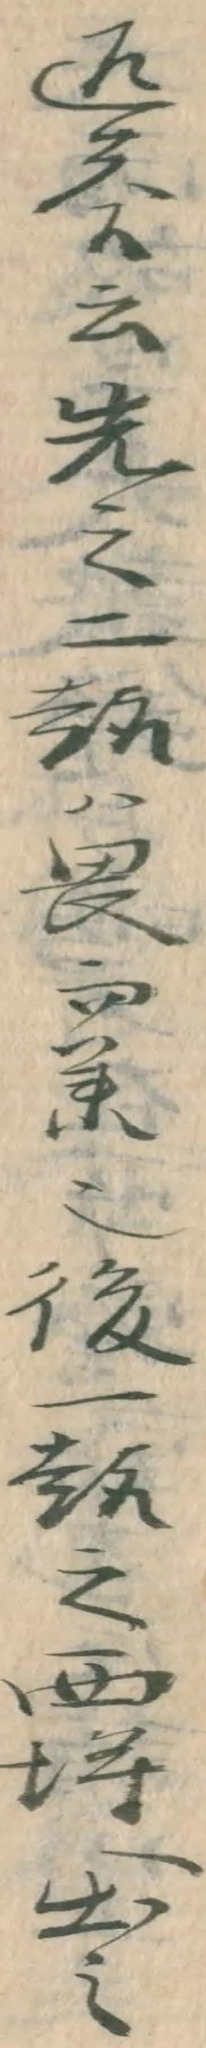返答云先之二趣ハ畏而承也後一趣之西埒ヘ出之
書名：賀茂社記録. 第10冊
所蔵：国立国会図書館 National Diet Library, JAPAN
